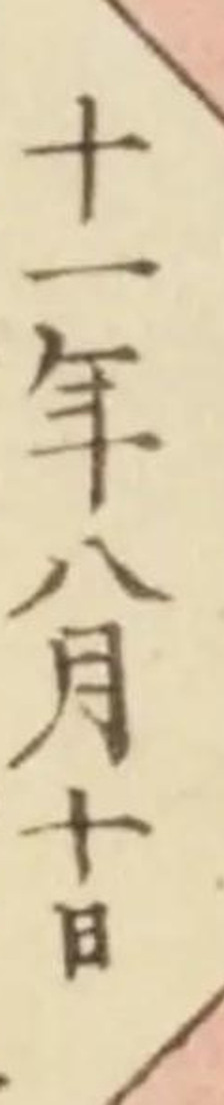十一年八月十日
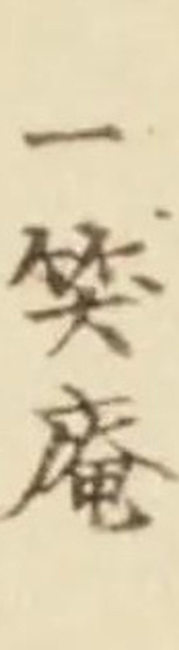一笑庵
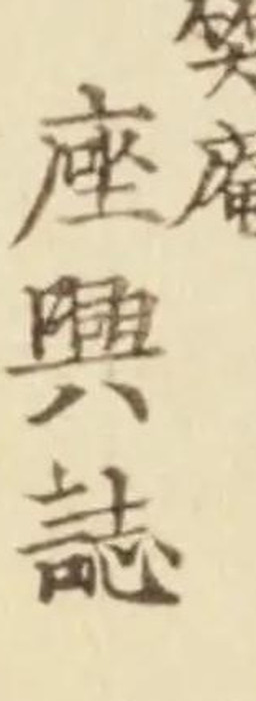座興誌
